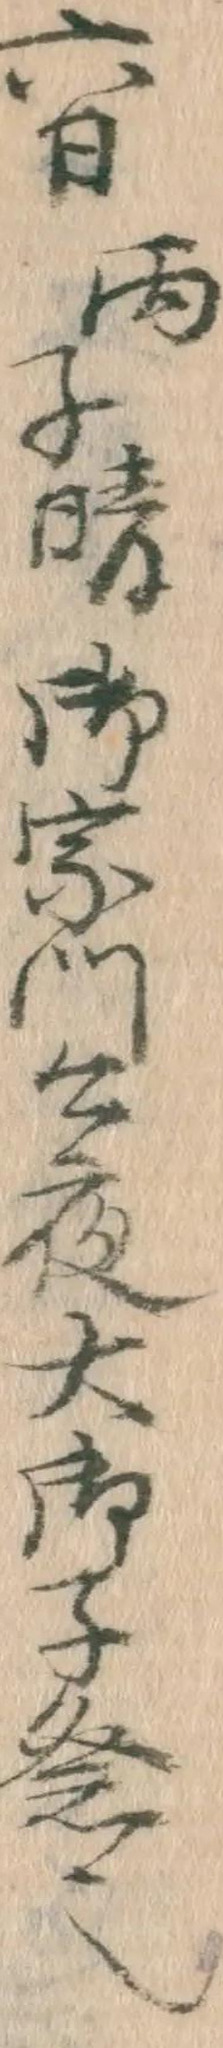六日丙子晴御家門今夜大御子祭也
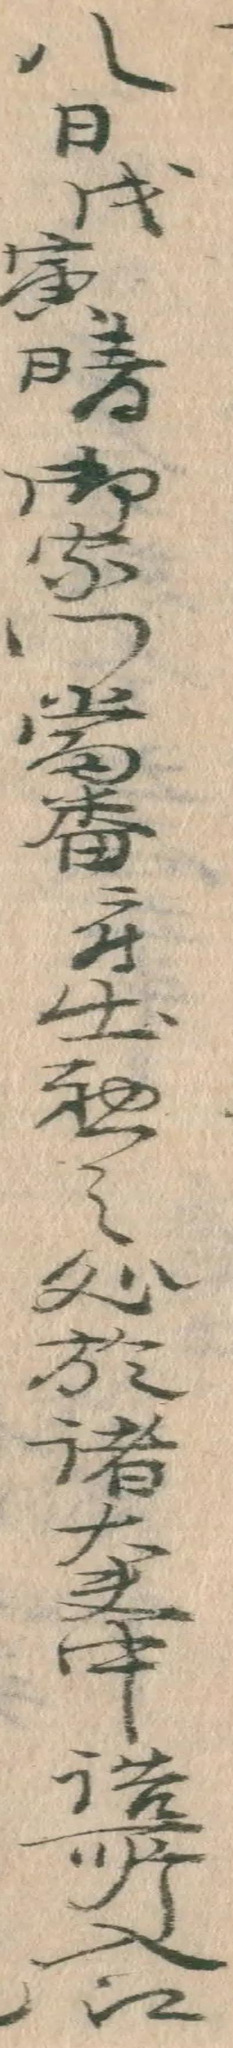八日戊寅晴御家門當番ニ付出惣之處於諸大夫中詰所入江
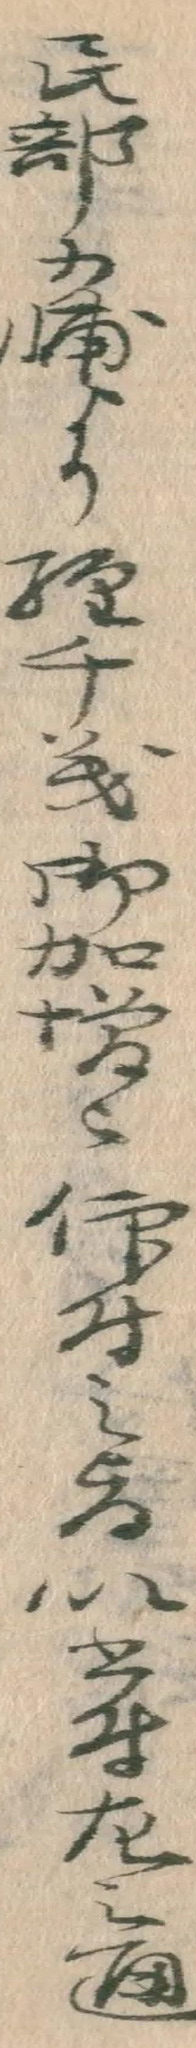民部少輔より経千義御加増被仰付之旨以書付左之通
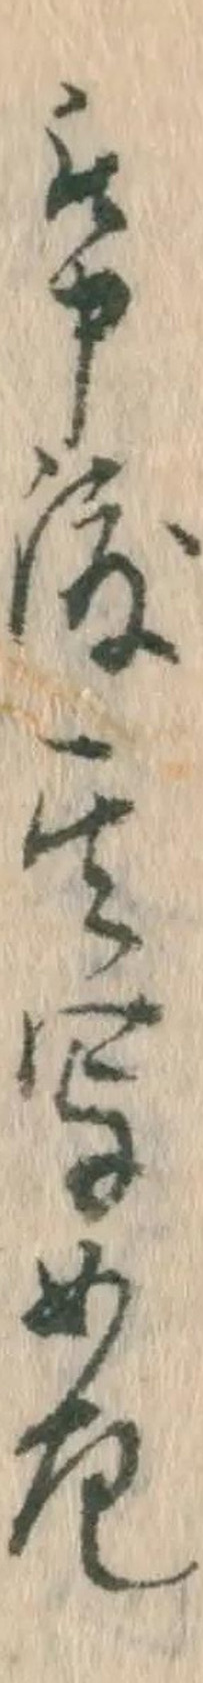被申渡其写如左
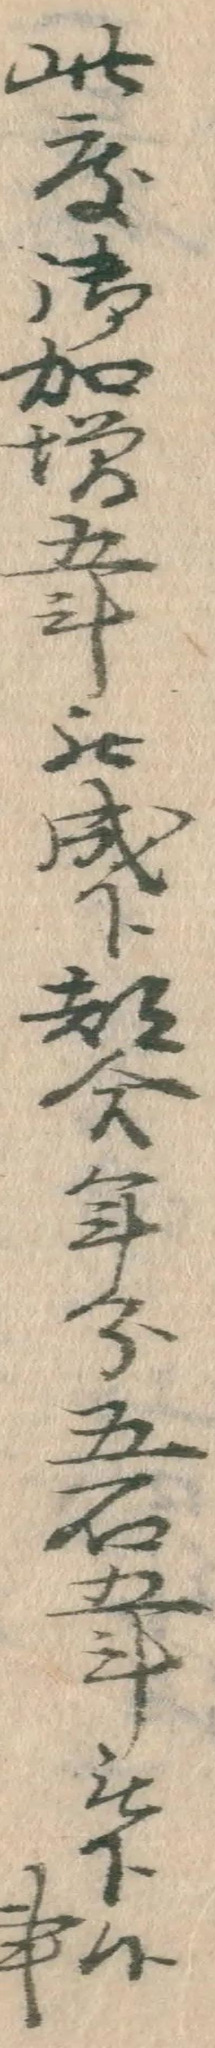此度御加増五斗被成下都合年分五石五斗被下候事
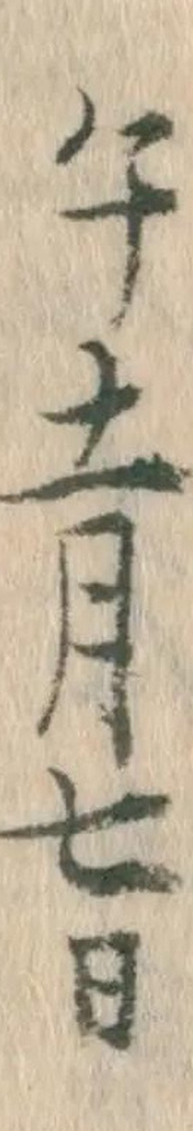午十一月七日
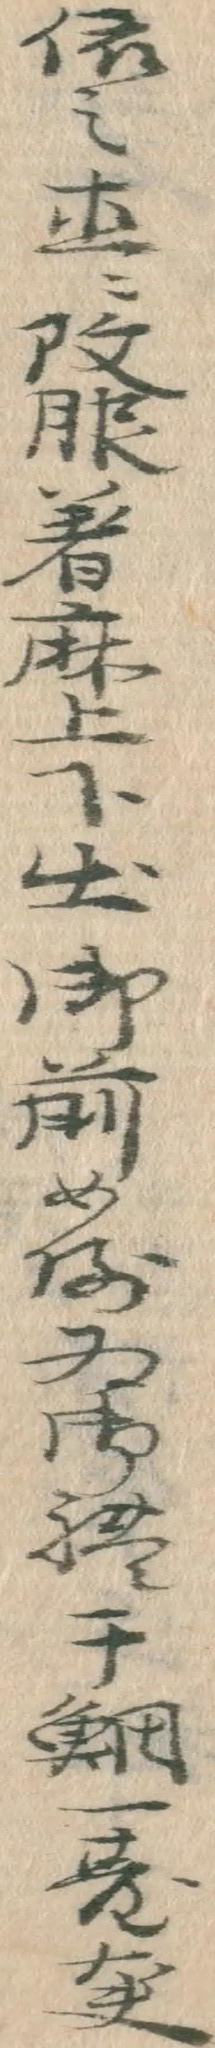依之直ニ改服着麻上下出御前如例為御禮干鯛一台大夫
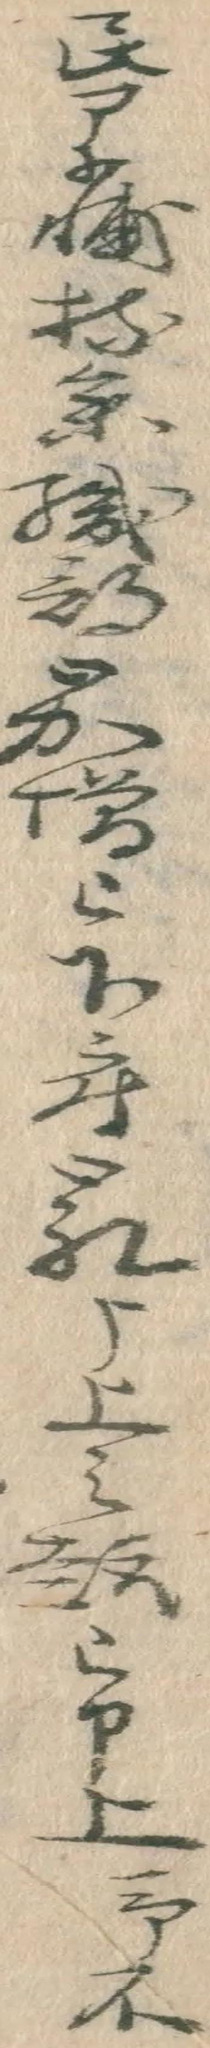民部少輔持参織部御加増被下ニ付御礼申上之趣被申上予不
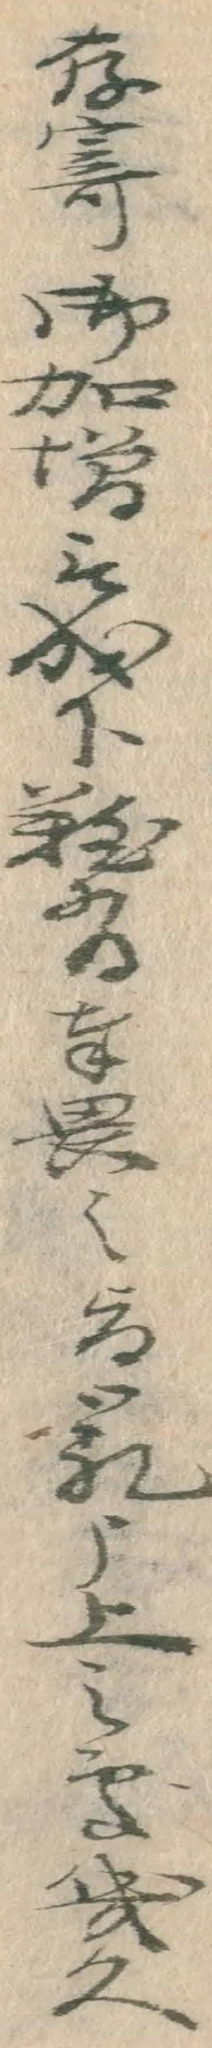存寄御加増被成下難有奉畏之旨御礼申上之處幾久
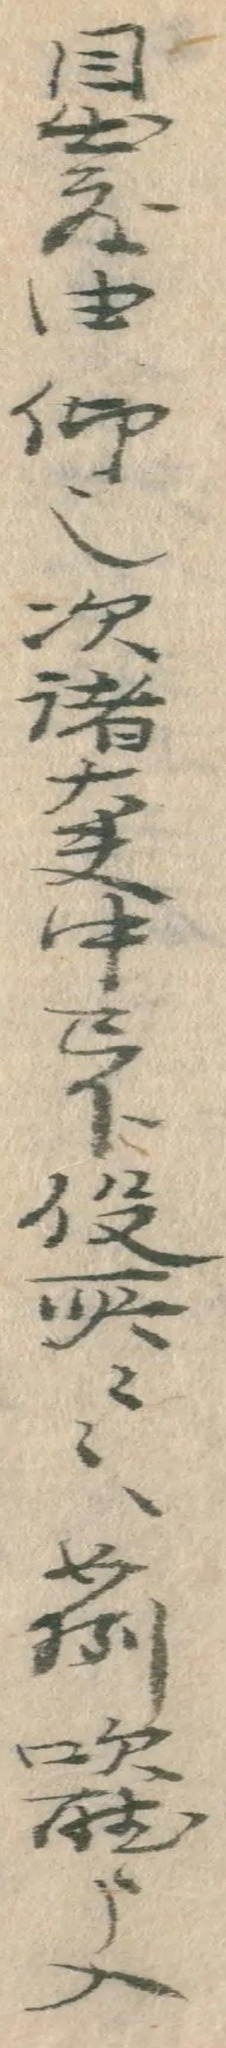目出度由仰也次諸大夫中已下役所々々へ如例吹聴申入
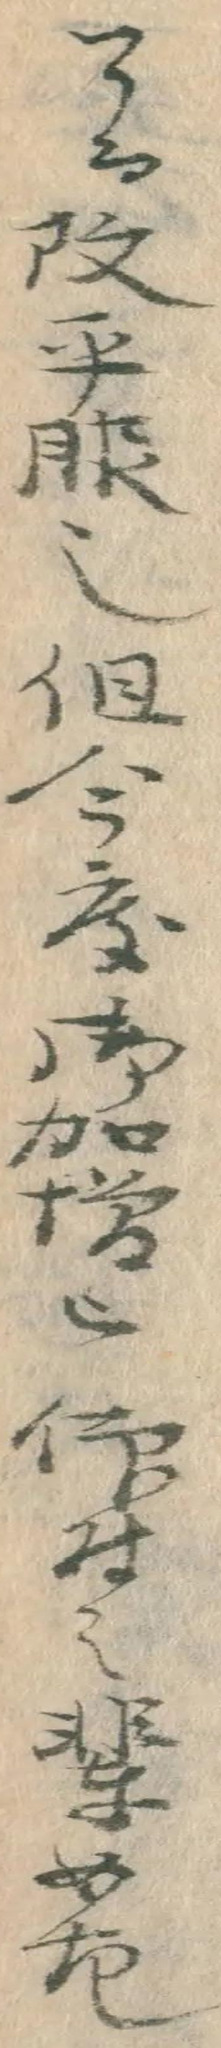了而改平服也但今度御加増被仰付之輩如左

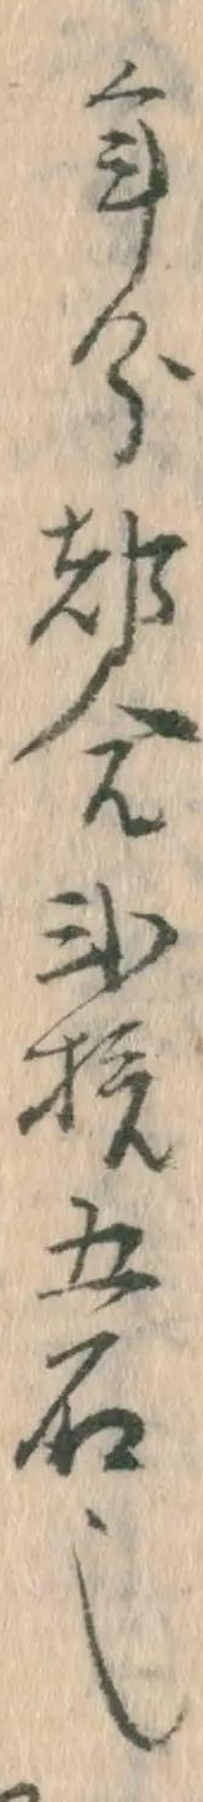年分都合弐拾五石也
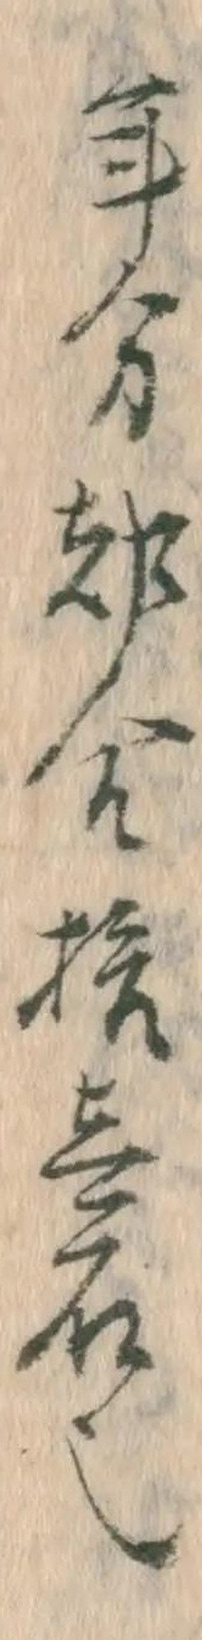年分都合拾壱石也
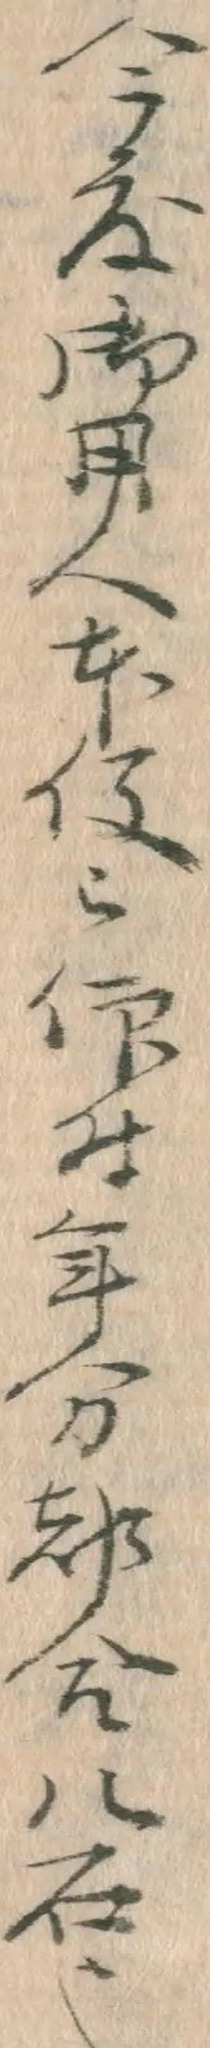今度御用人本役被仰付年分都合八石也
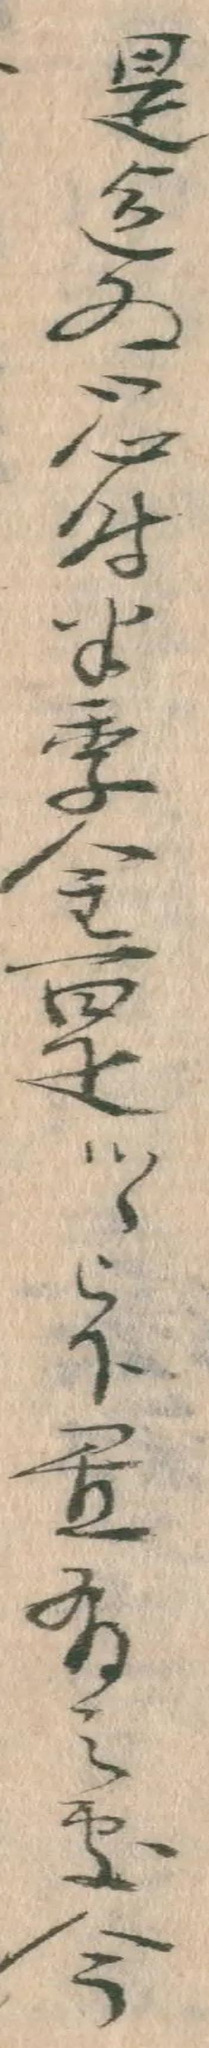是迄為御心付半季金百疋ツヽ被下置有之處今
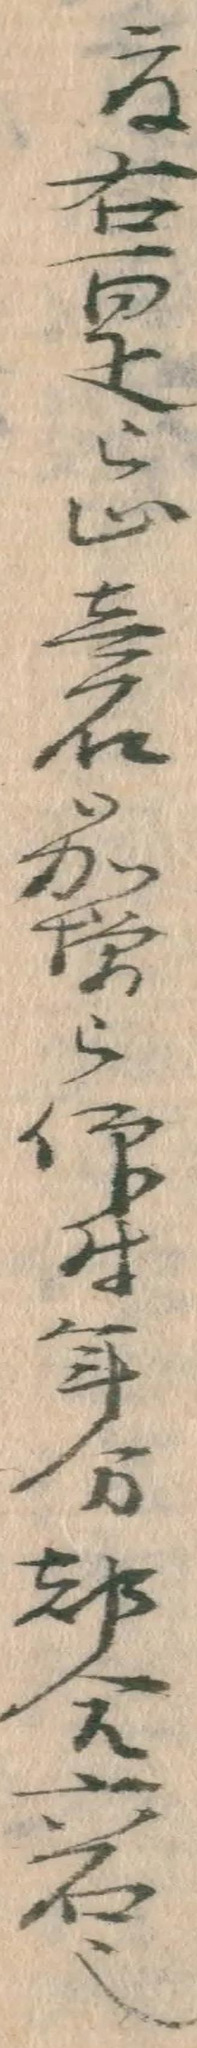度右百疋被止壱石御加増被仰付年分都合六石也
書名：賀茂社記録. 第63冊
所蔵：国立国会図書館 National Diet Library, JAPAN
